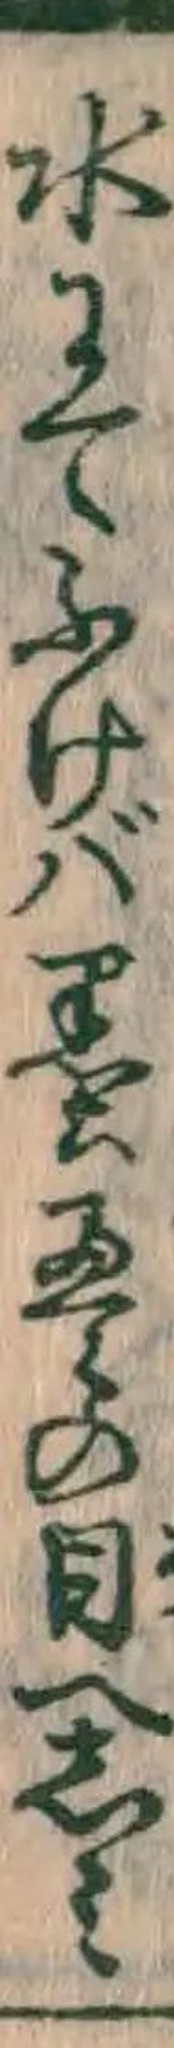水にてふけば墨畳の目へしみ
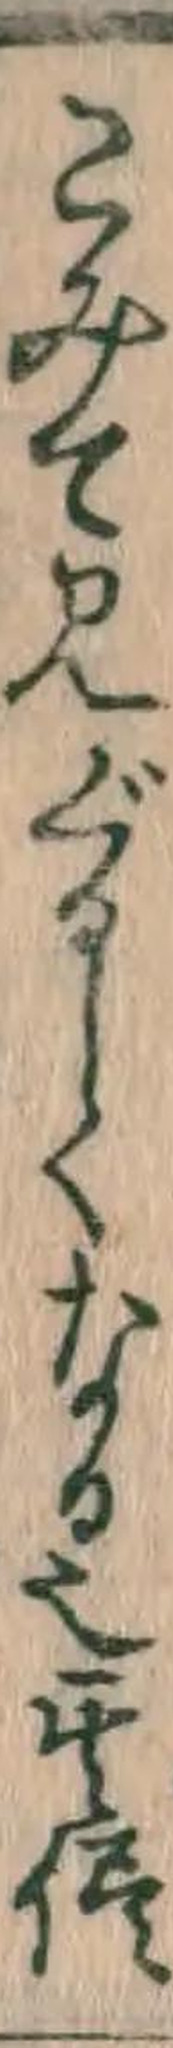こみて見ぐるしくなる也其侭
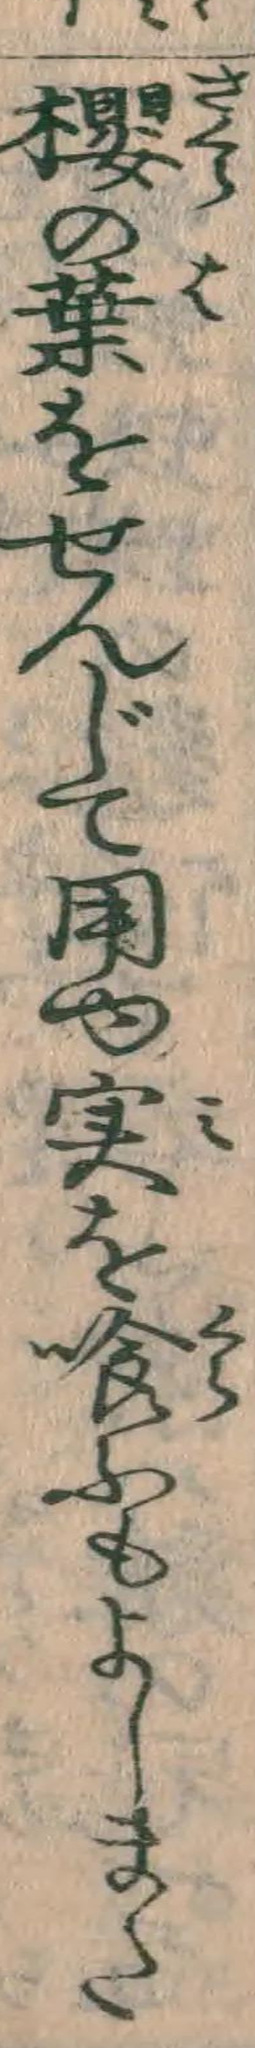桜の葉をせんじて用ゆ実を喰ふもよしまた
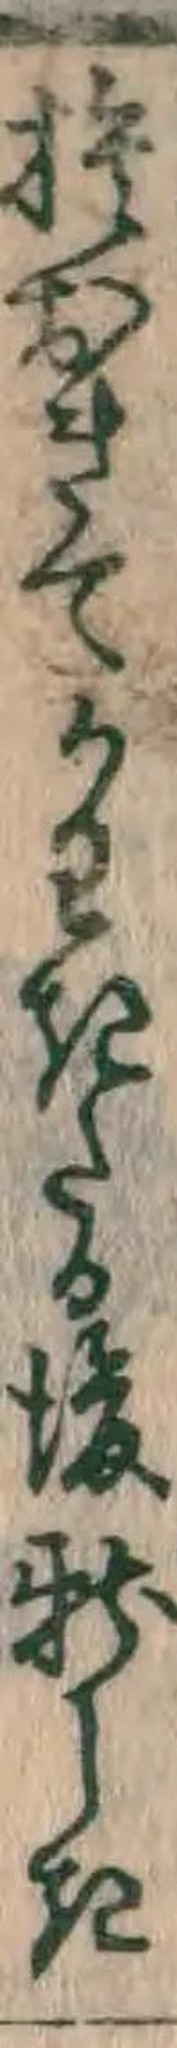捨おきてかわきたる後新しき
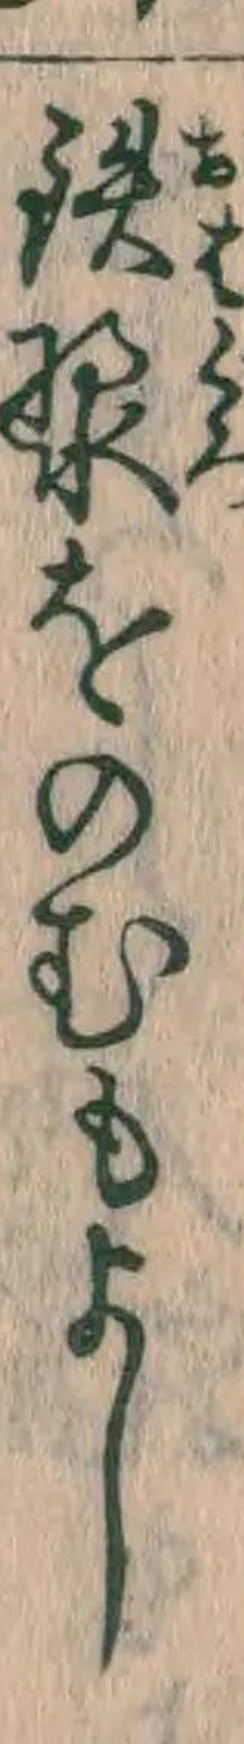鉄漿をのむもよし
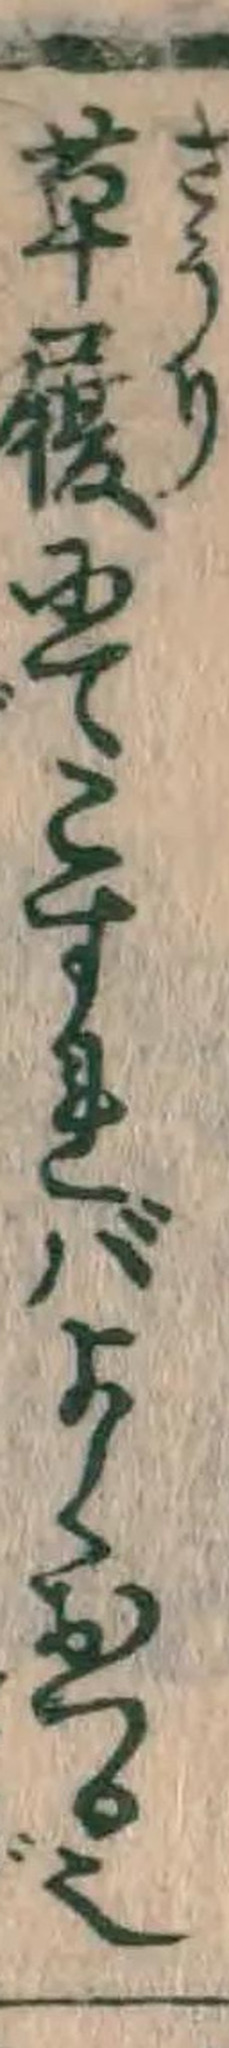草履にてこすればよくおつる也
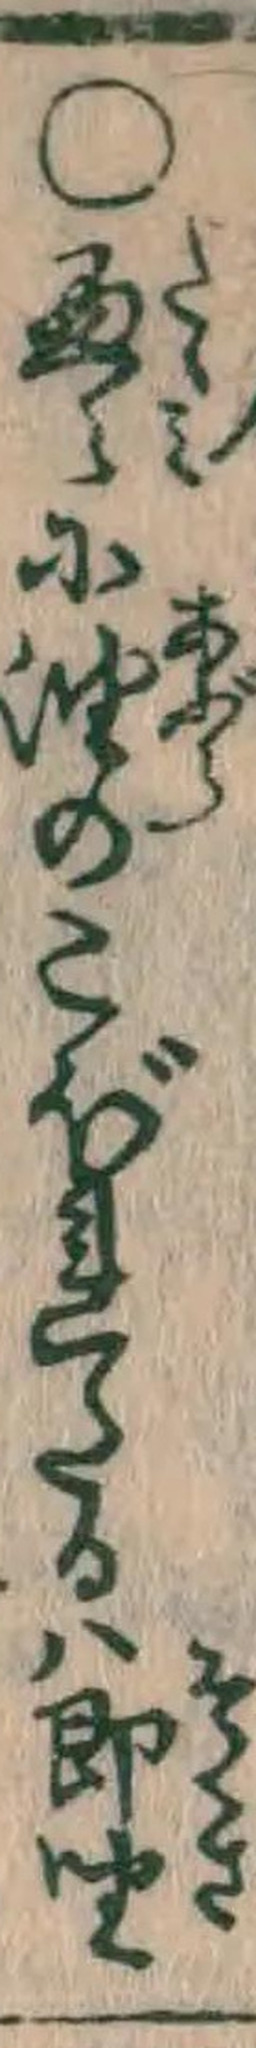○畳に油のこぼれたるは即坐
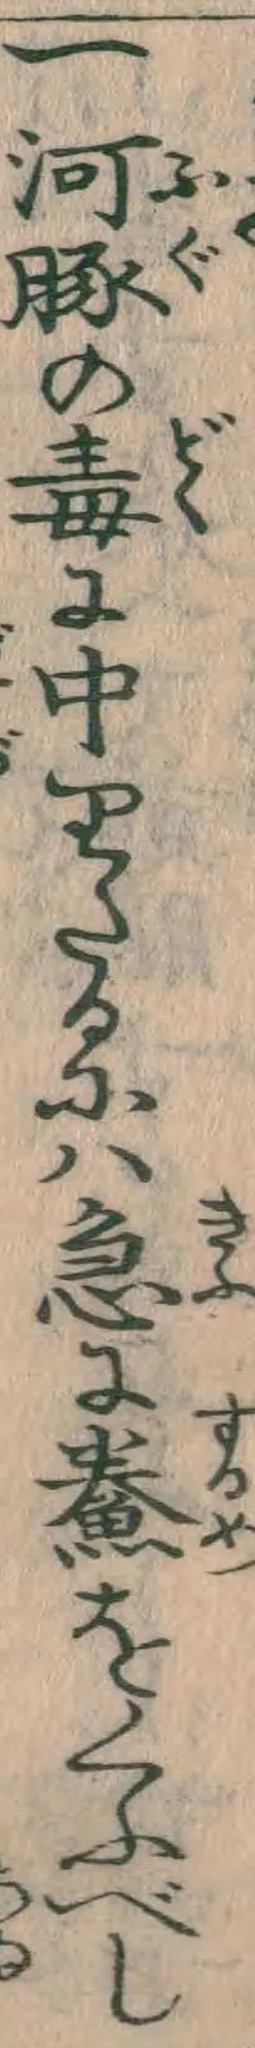一河豚の毒に中りたるには急に鮝をくふべし
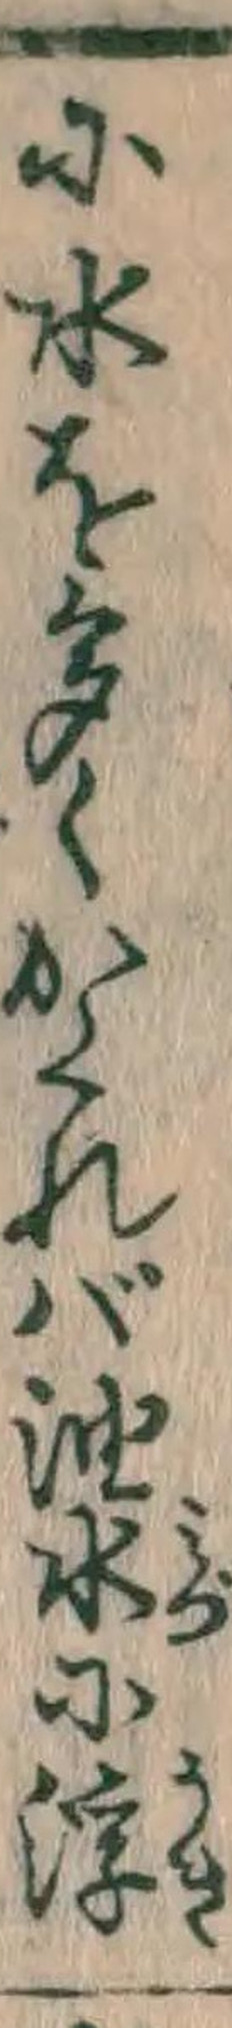に水を多くかくれば油水に浮
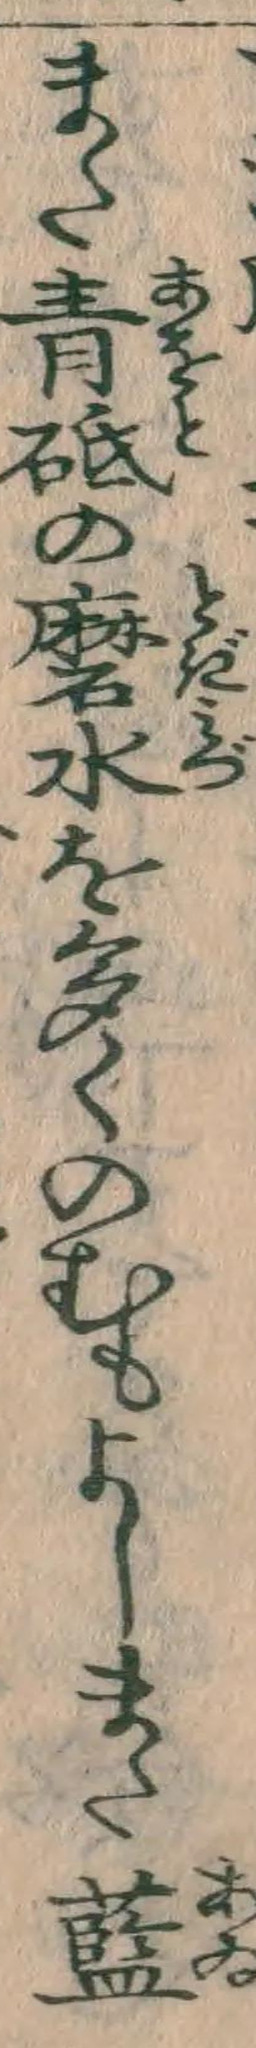また青砥の磨水を多くのむもよしまた藍
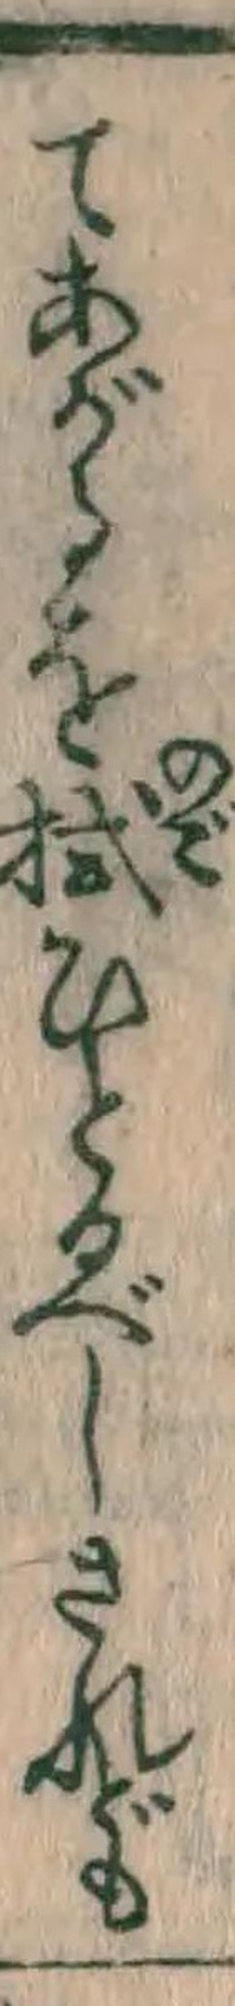てあがるを拭ひとるべしされども
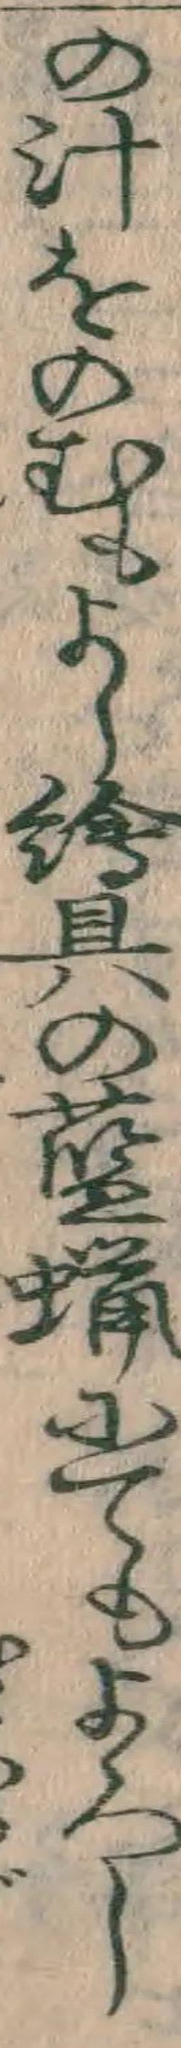の汁をのむもよし絵具の藍蝋にてもよろし
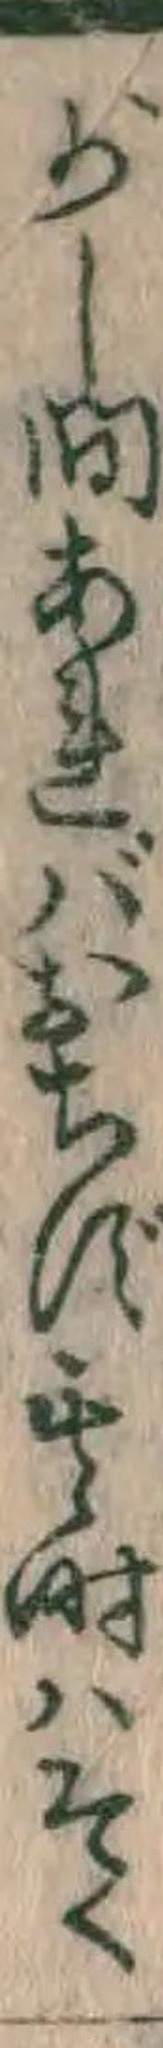少し間あればおちず其時はそく
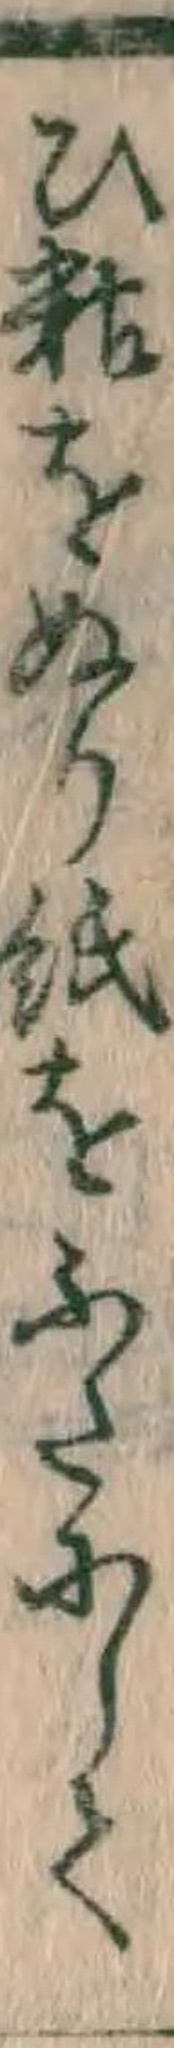ひ粘をぬり紙をふたにして
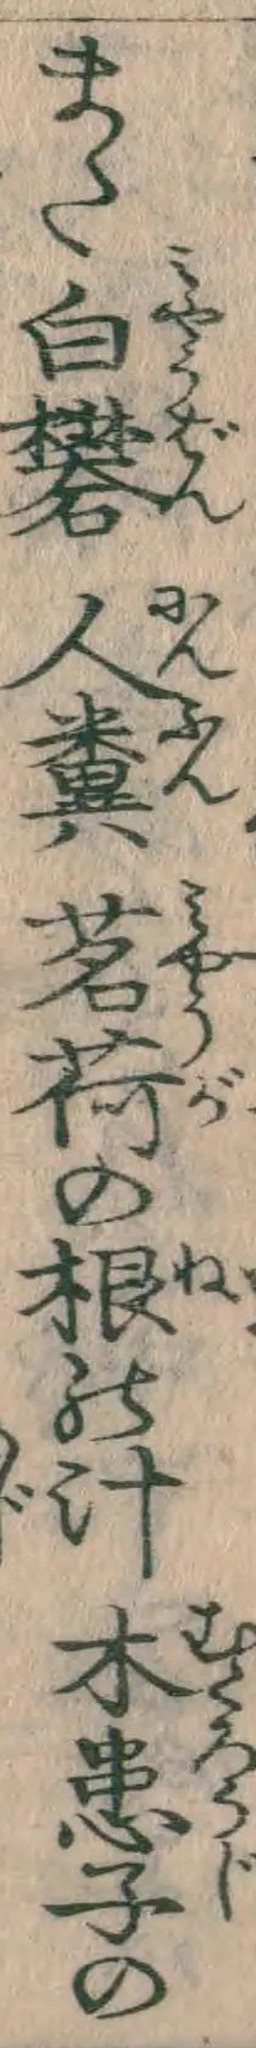また白礬人糞茗荷の根の汁木患子の
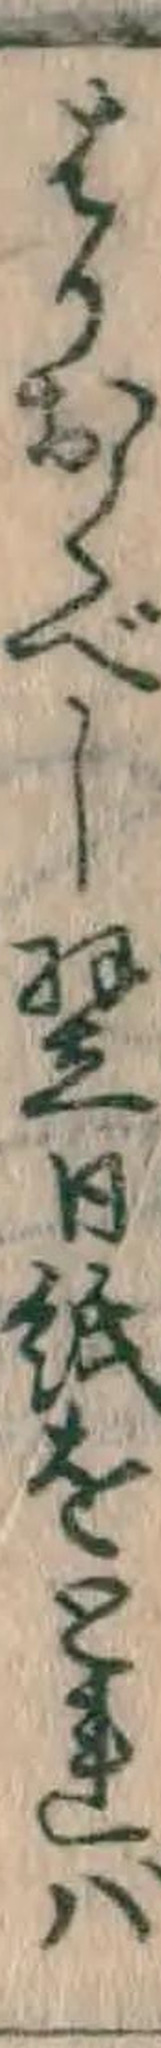はりおくべし翌日紙をとれば
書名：広益秘事大全 3巻. [3]
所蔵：国立国会図書館 National Diet Library, JAPAN
